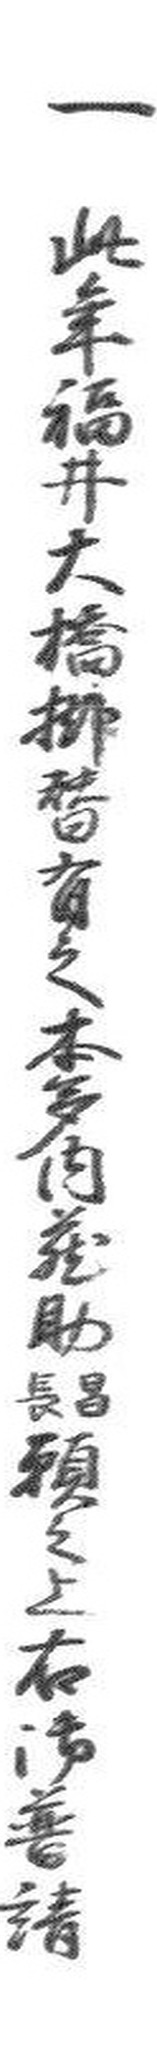一此年福井大橋掛替有之本多内蔵助昌長願之上右御普請
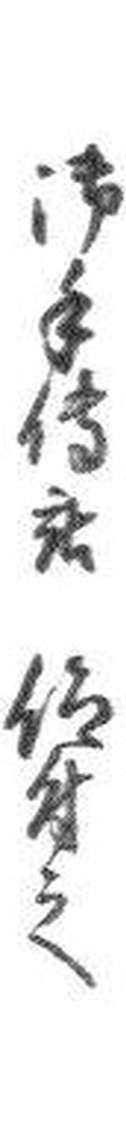御手伝被仰付之
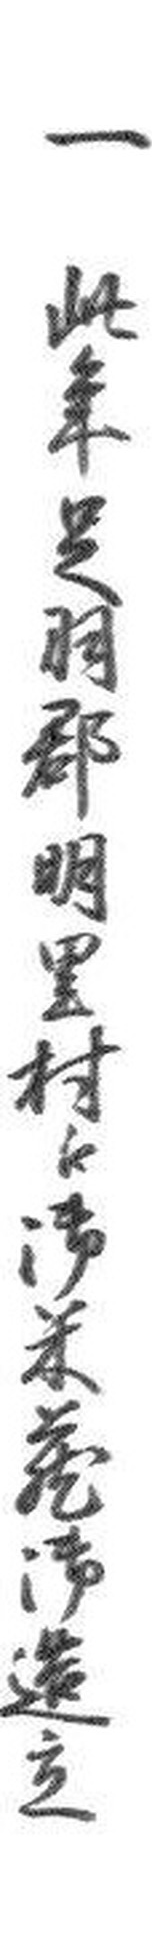一此年足羽郡明里村江御米蔵御造立ゝ

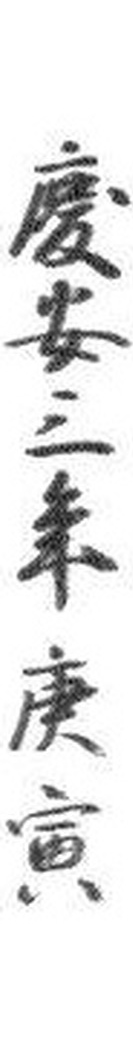慶安三年庚寅
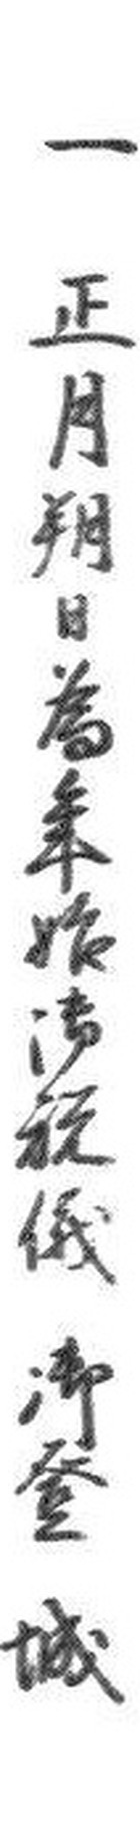一正月朔日為年始御祝儀御登城
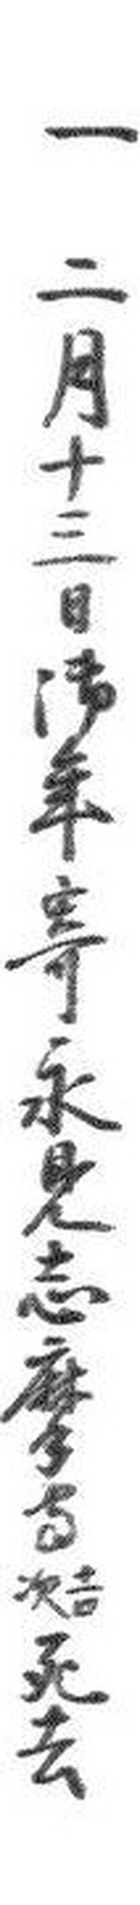一二月十三日御年寄永見志摩守吉次死去
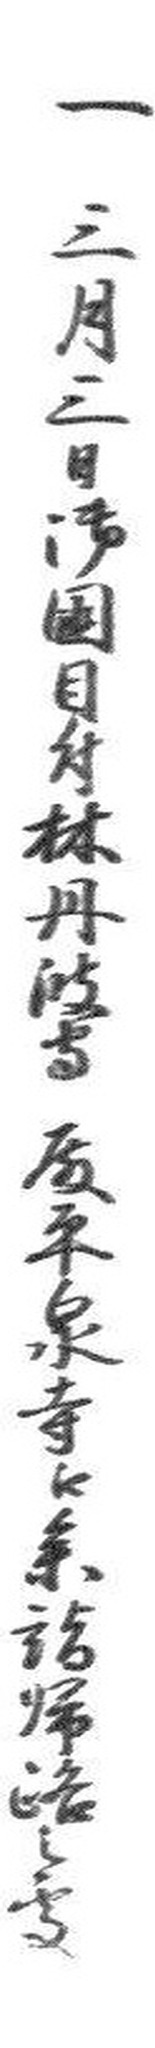一三月三日御国目付林丹波守殿平泉寺江参詣帰路之処
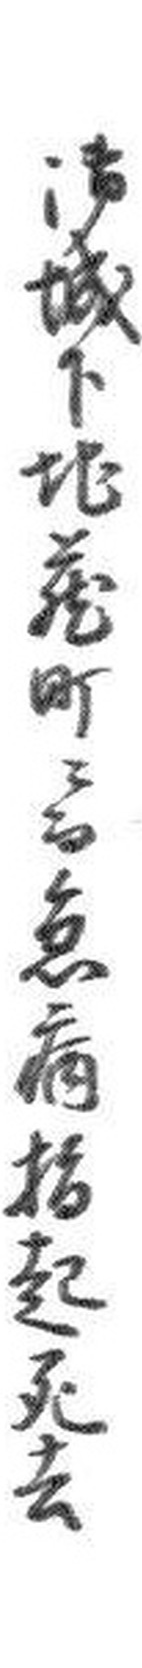御城下地蔵町ニ而急病指起死去
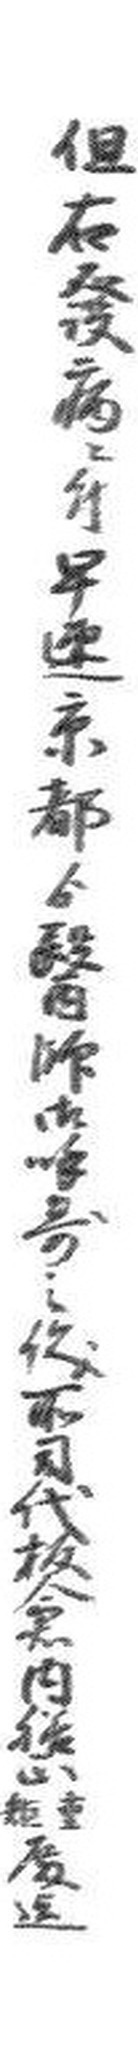但右発病ニ付早速京都ゟ医師御呼寄之儀所司代板倉内膳正重矩殿
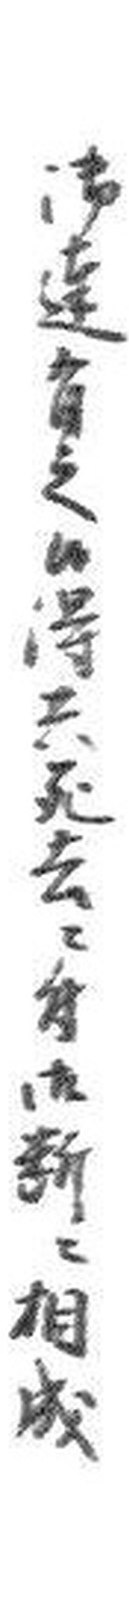御達有之候得共死去ニ付御断ニ相成
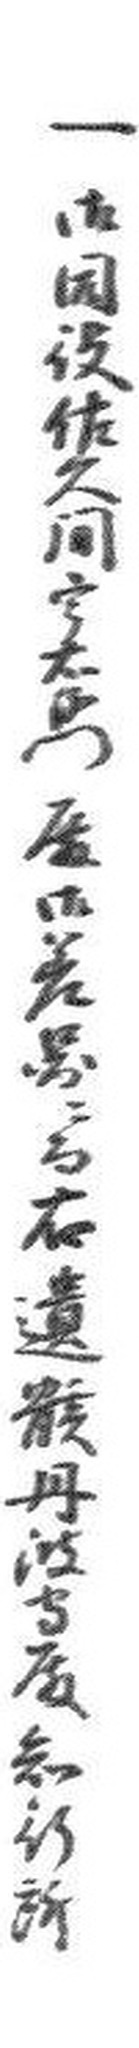一御国役佐久間宇右衛門殿御差図ニ而右遺骸丹波守殿知行所

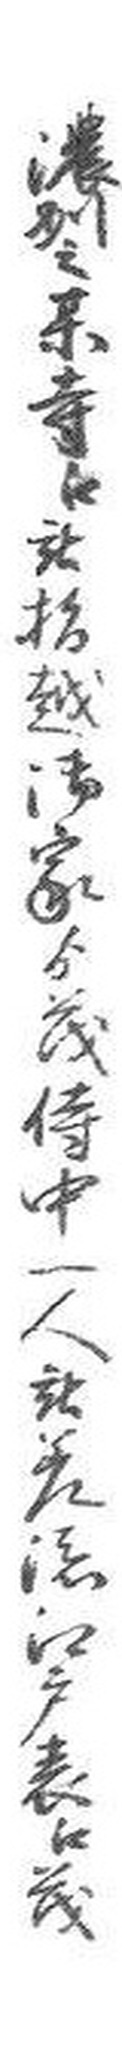濃州之某寺江被指越御家ゟ茂侍中一人被差添江戸表江
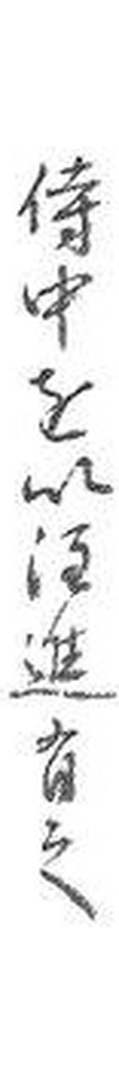侍中を以注進有之
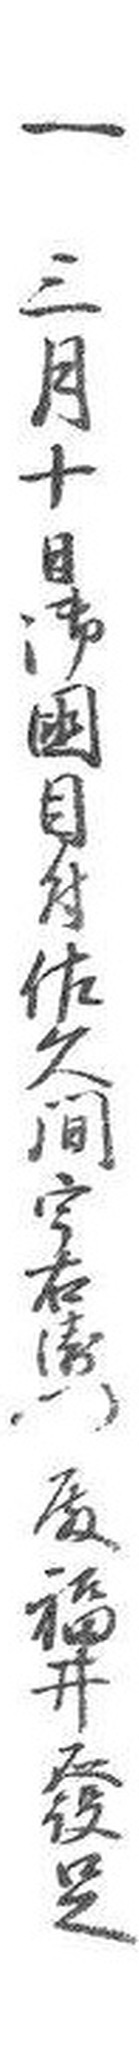一三月十日御国目付佐久間宇右衛門殿福井発足
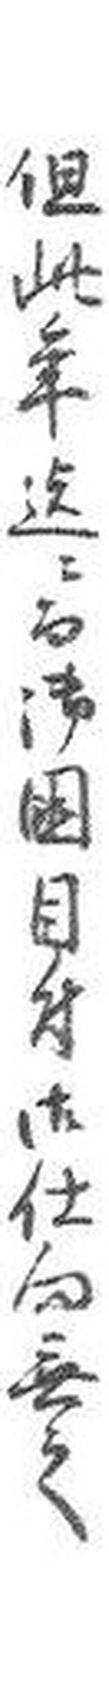但此年迄ニ而御国目付御仕向無之
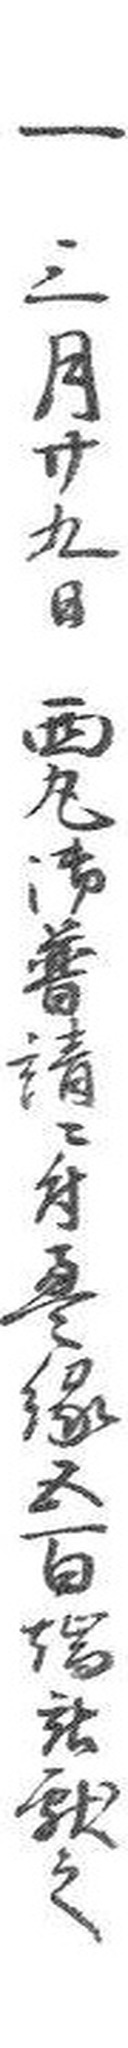一三月廿九日西丸御普請ニ付畳縁五百端被献之
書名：家譜 五 光通公 従寛永十三年到万治二年
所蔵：福井県文書館 Fukui Prefectural Archives
